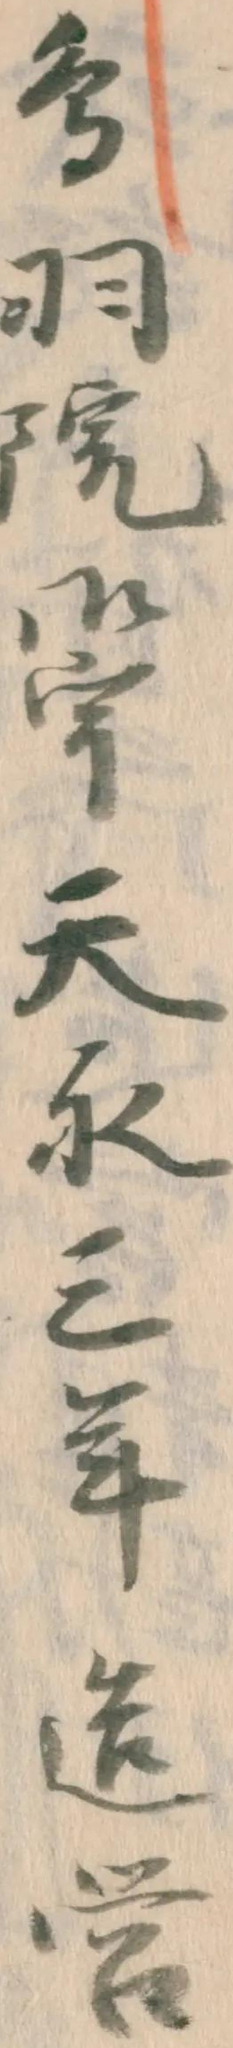鳥羽院御宇天永三年造営
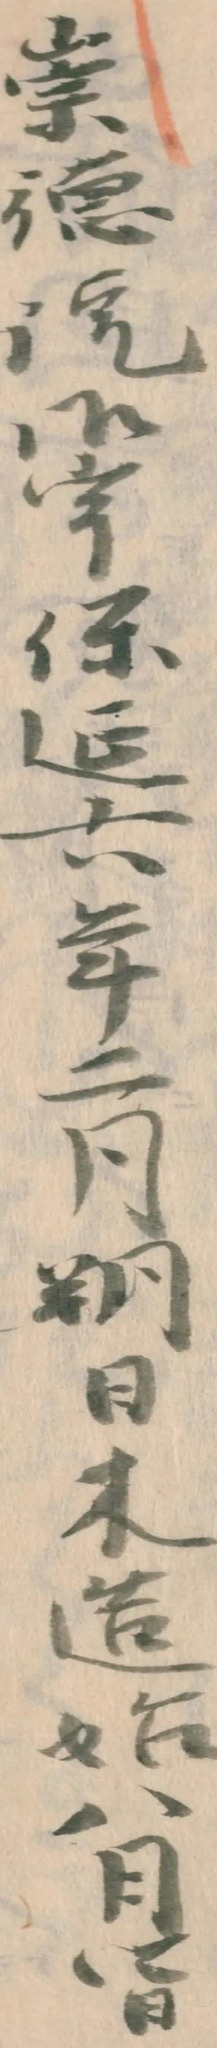崇徳院御宇保延六年二月朔日木造始八月四日
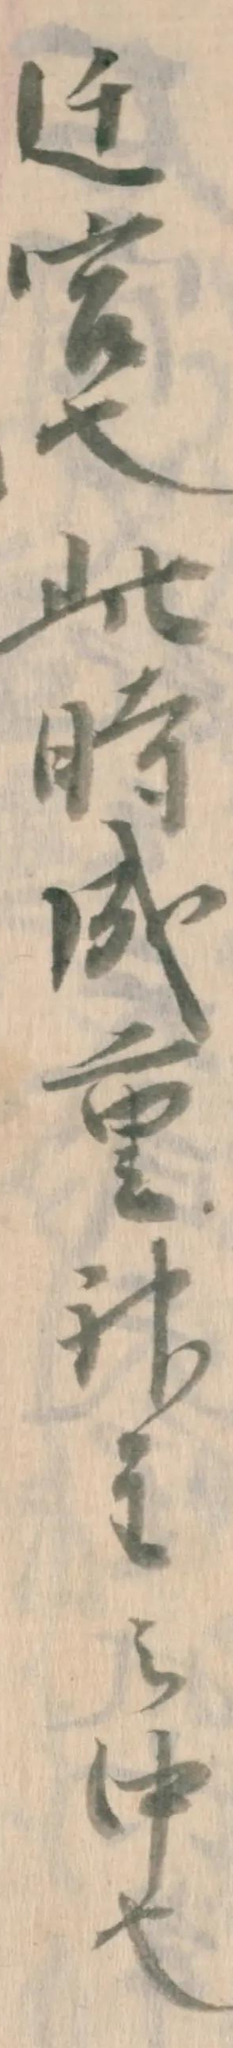遷宮也此時成重神主之中也
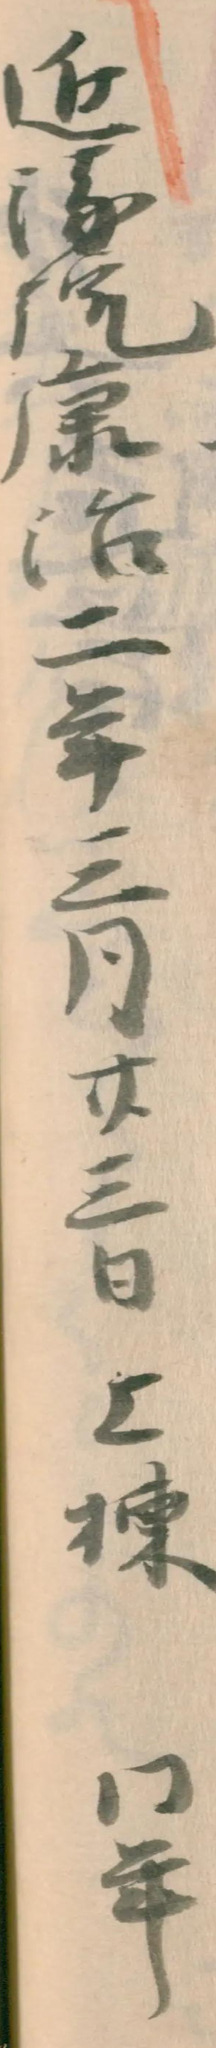近衛院康治二年三月廿三日上棟同年
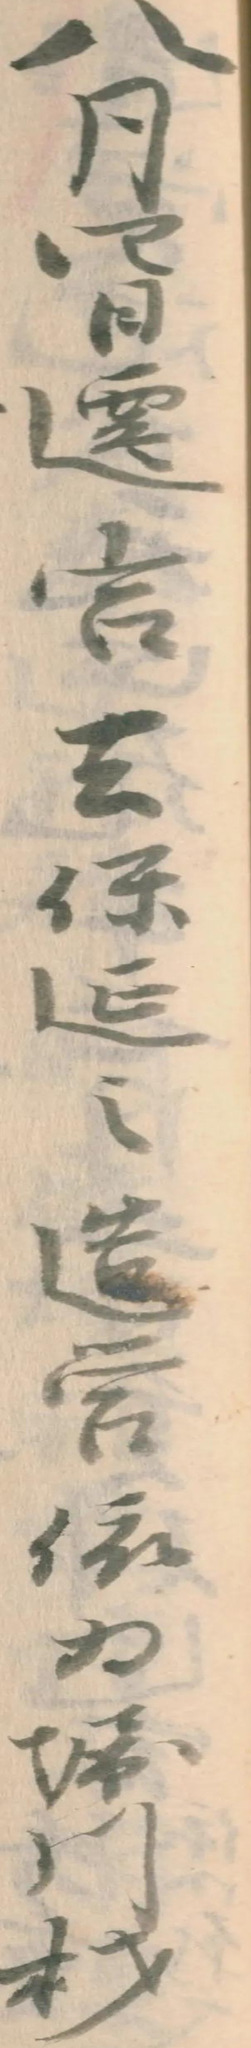八月四日遷宮去保延之造営依為堀川材
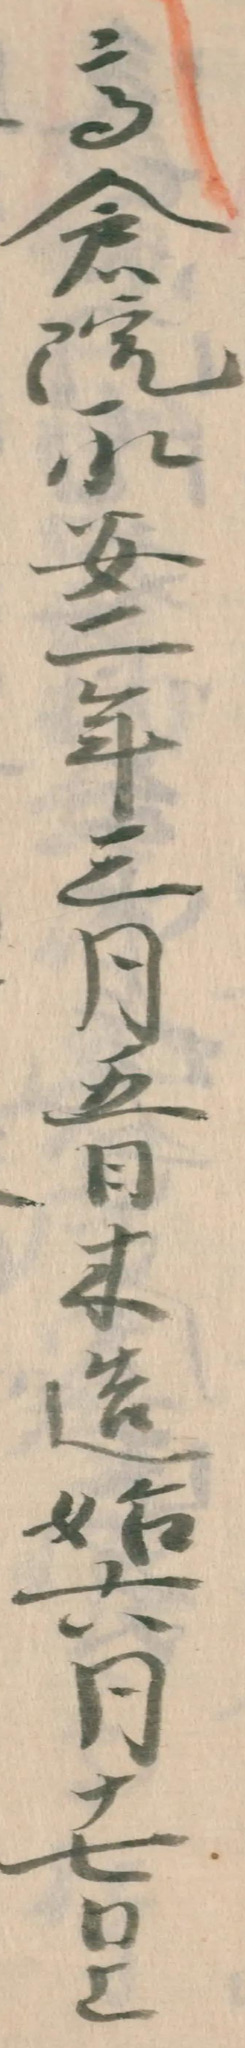高倉院承安二年三月五日木造始六月十七日上
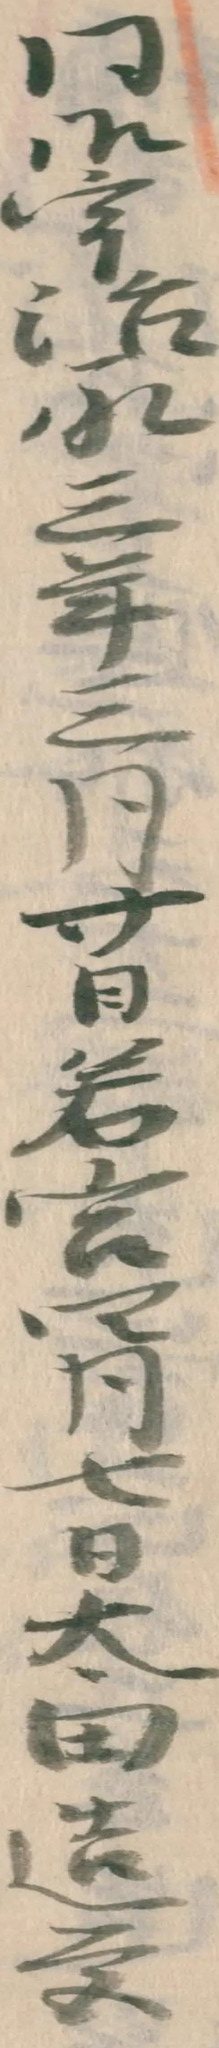同御宇治承三年三月廿日若宮四月七日太田造営
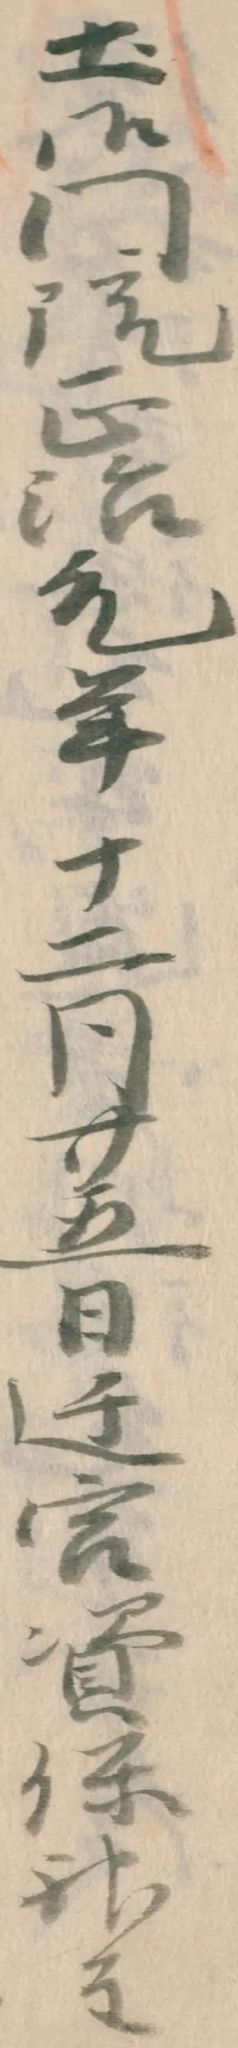土御門院正治元年十二月廿五日遷宮資保神主
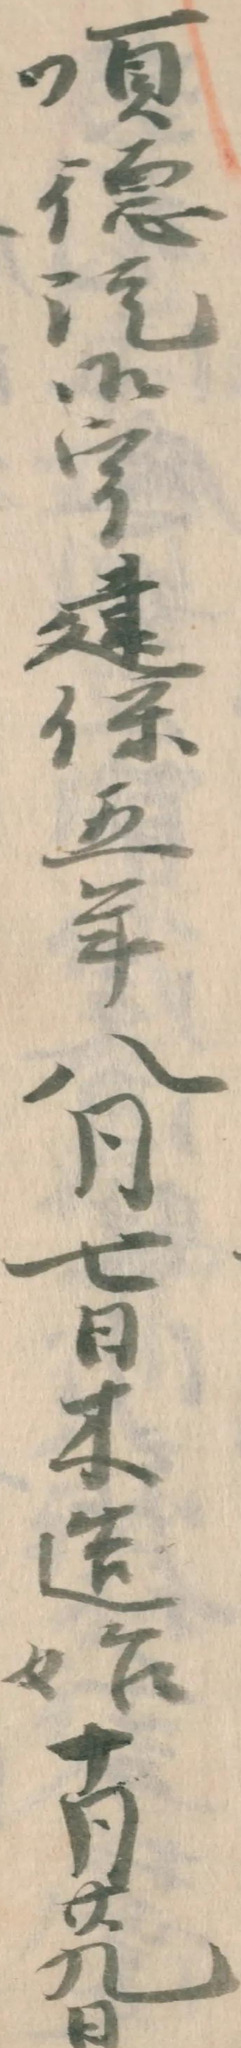順徳院御宇建保五年八月七日木造始十月廿九日
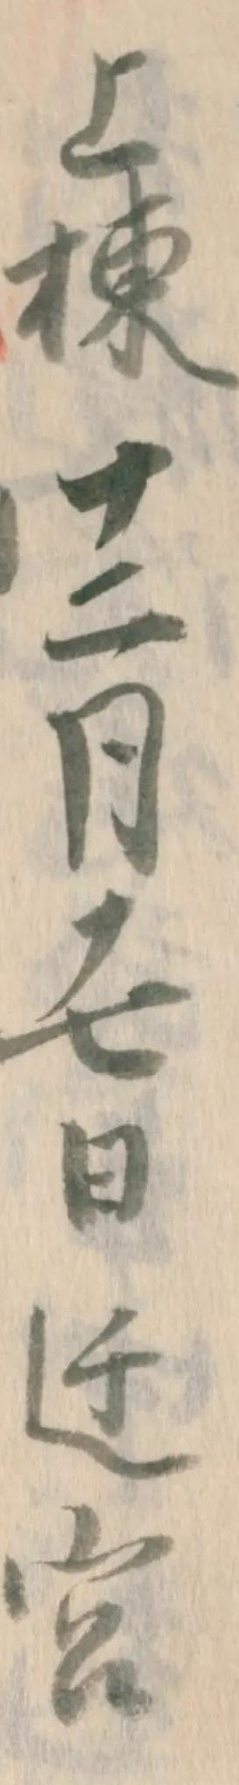上棟十二月十七日遷宮
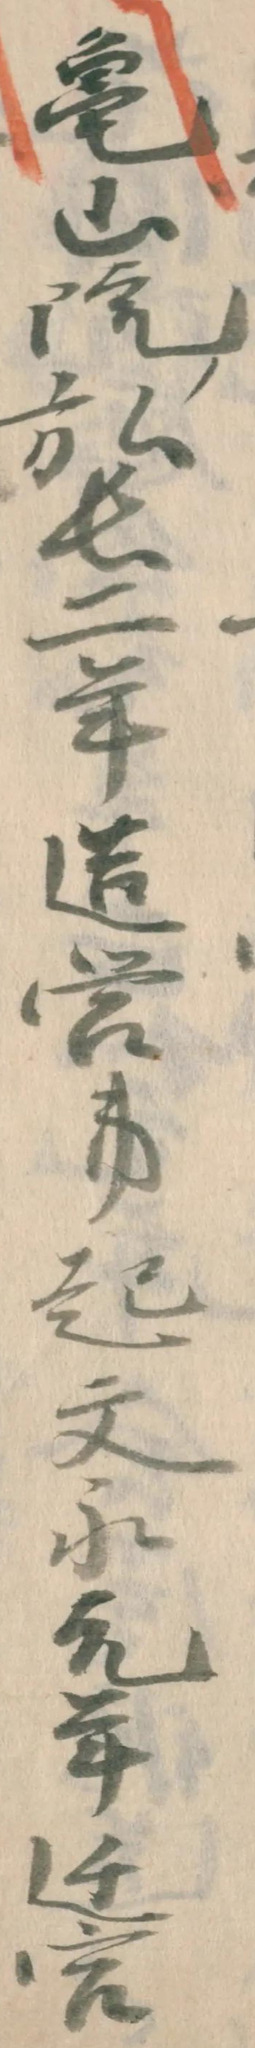亀山院弘長二年造営事起文永元年遷宮
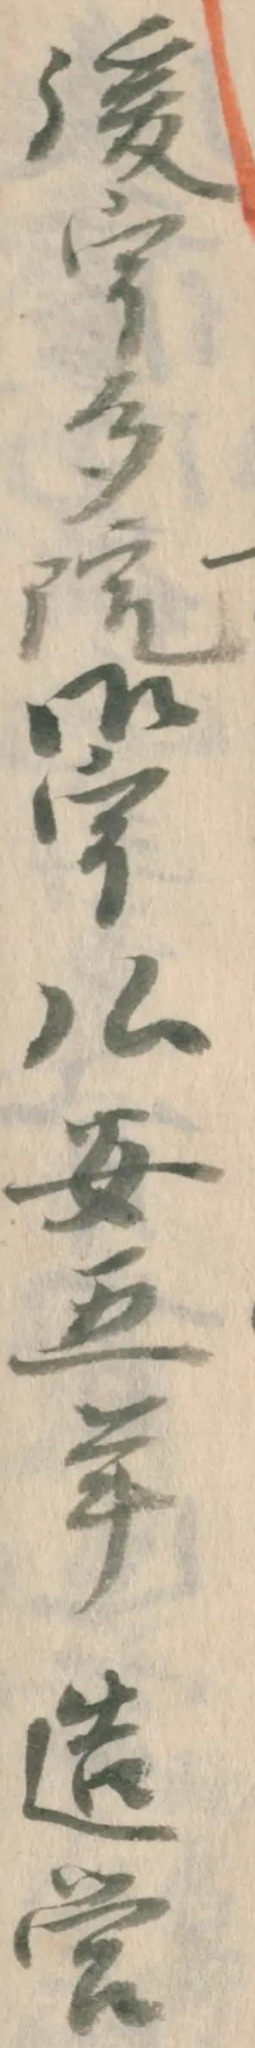後宇多院御宇弘安五年造営

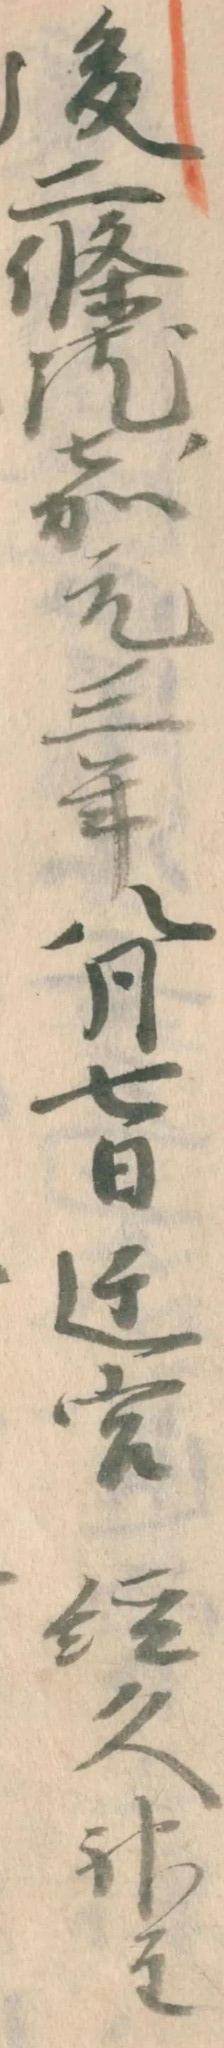後二条院嘉元三年八月七日遷宮經久神主
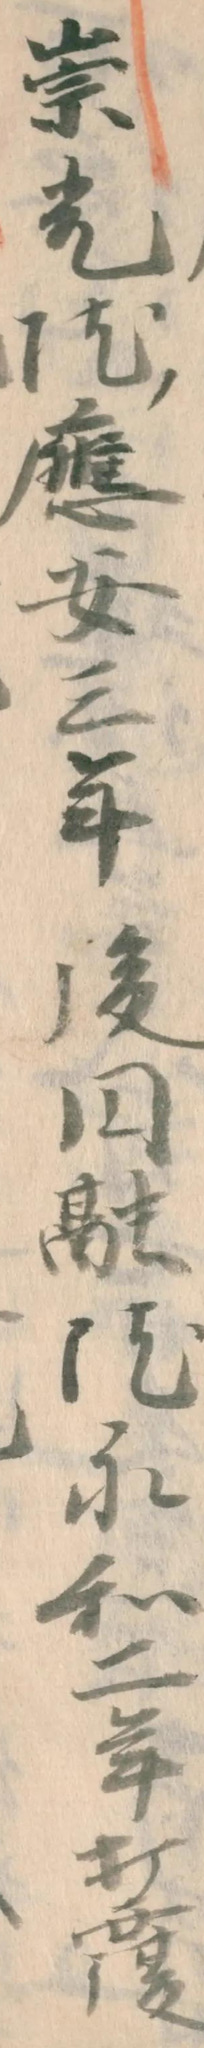崇光院應安三年後円融院永和二年打覆
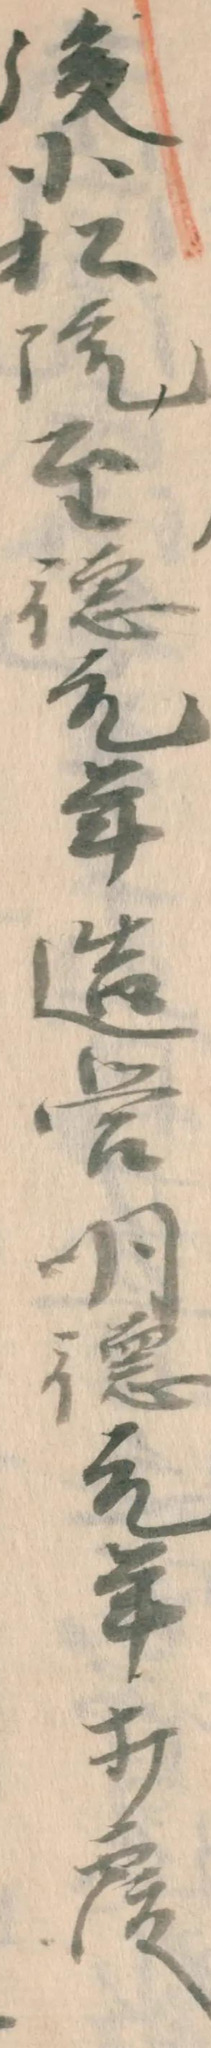後小松院至徳元年造営明徳元年打覆
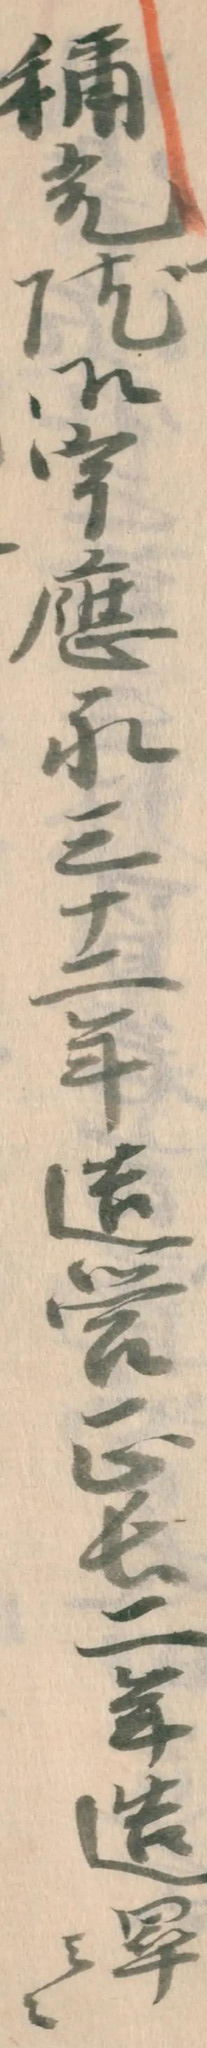称光院御宇応永三十二年造営正長二年造畢云々
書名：賀茂社記録. 第1冊
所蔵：国立国会図書館 National Diet Library, JAPAN
